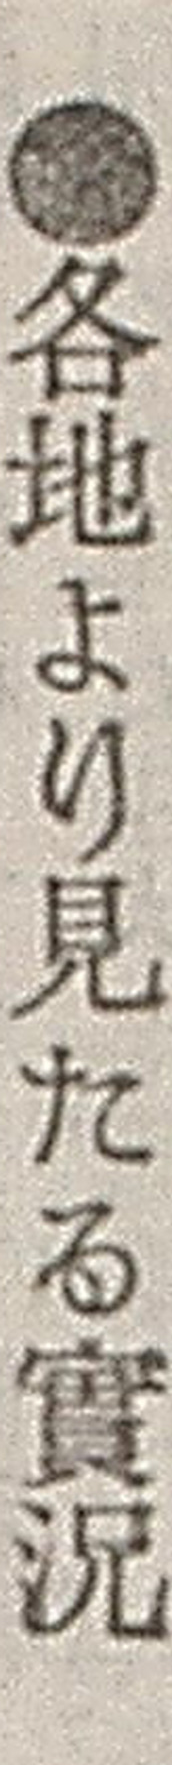●各地より見たる実況
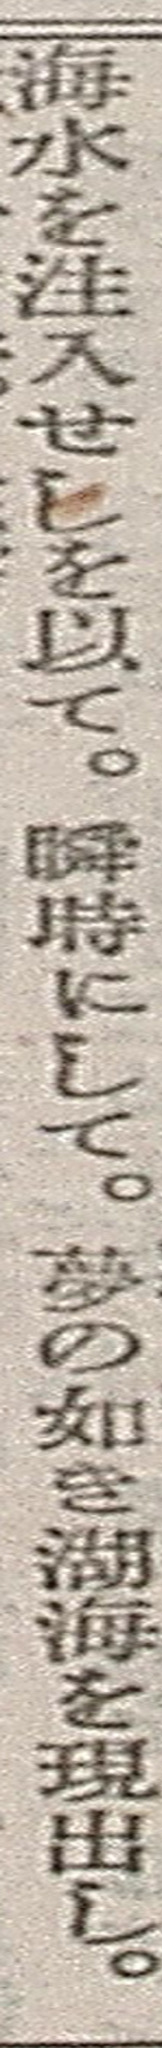海水を注入せしを以て。瞬時にして。夢の如き湖海を現出し。
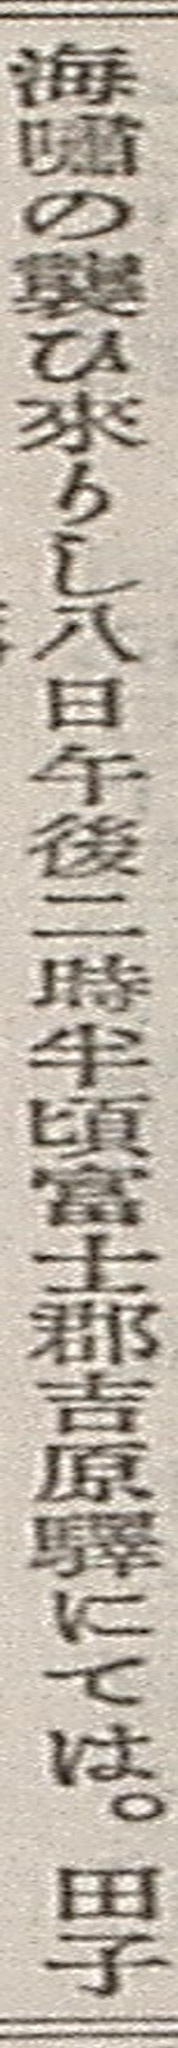海嘯の襲ひ来りし八日午後二時半頃富士郡吉原駅にては。田子
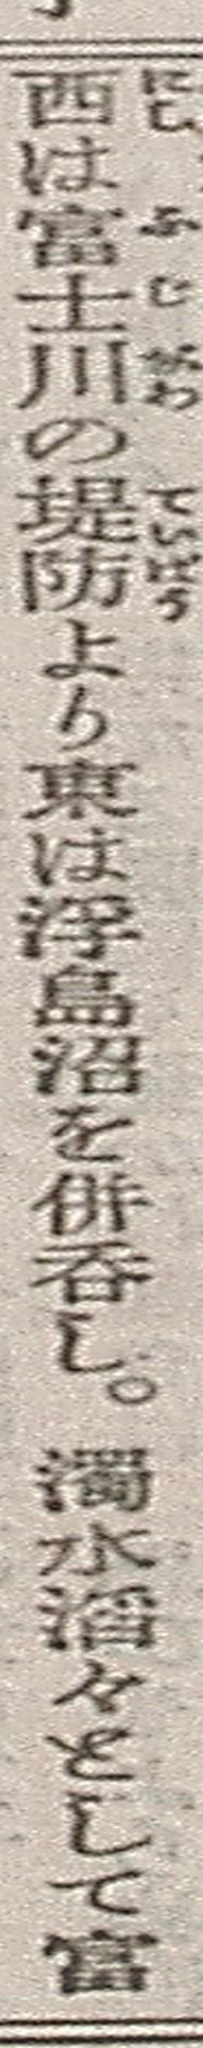西は富士川の堤防より東は浮島沼を併呑し。濁水滔々として富
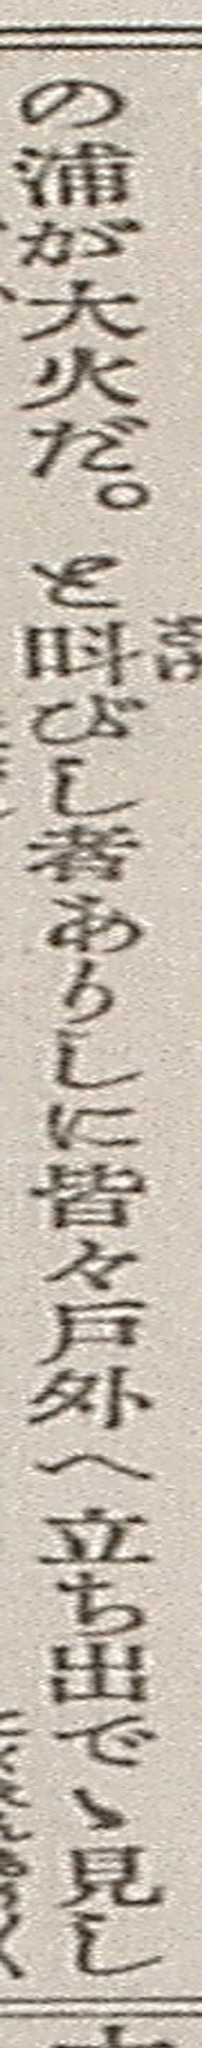の浦が大火だ。と叫びし者ありしに皆々戸外へ立ち出でゝ見し
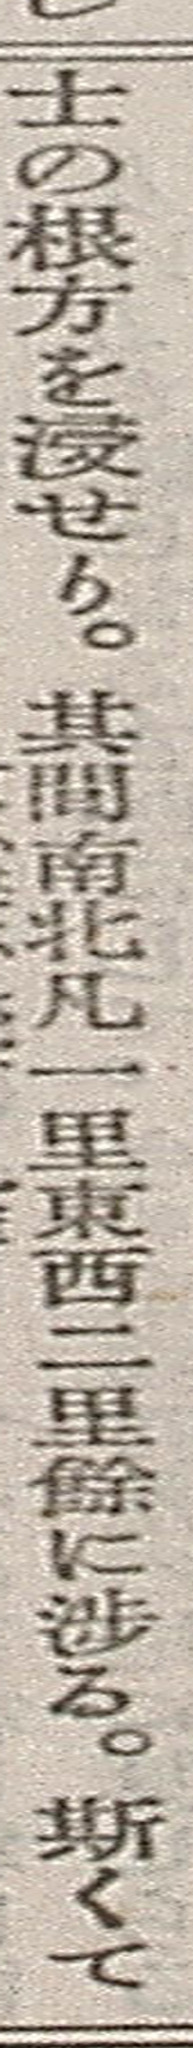士の根方を浸せり。其間南北凡一里東西二里余に渉る。斯くて
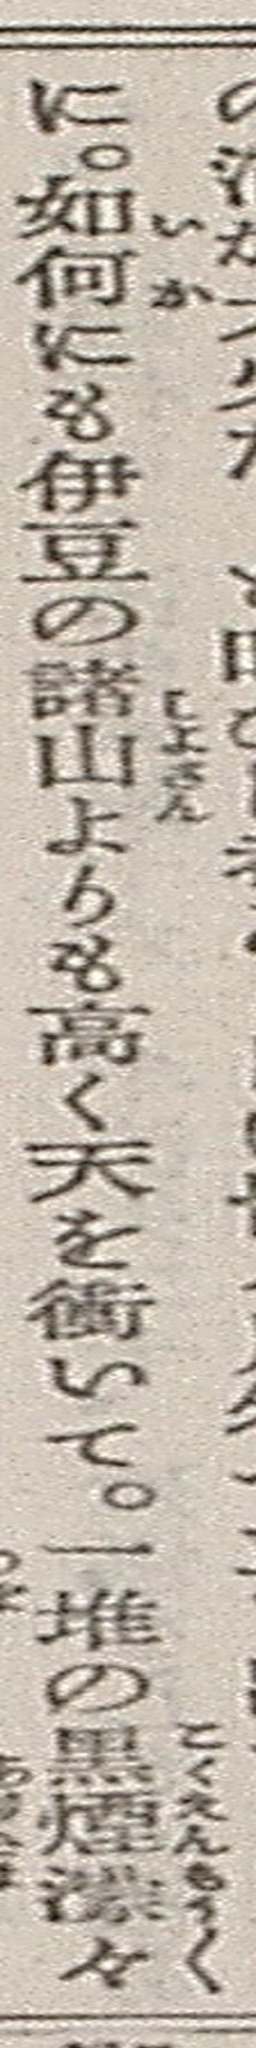に。如何にも伊豆の諸山よりも高く天を衝いて。一堆の黒煙濛々
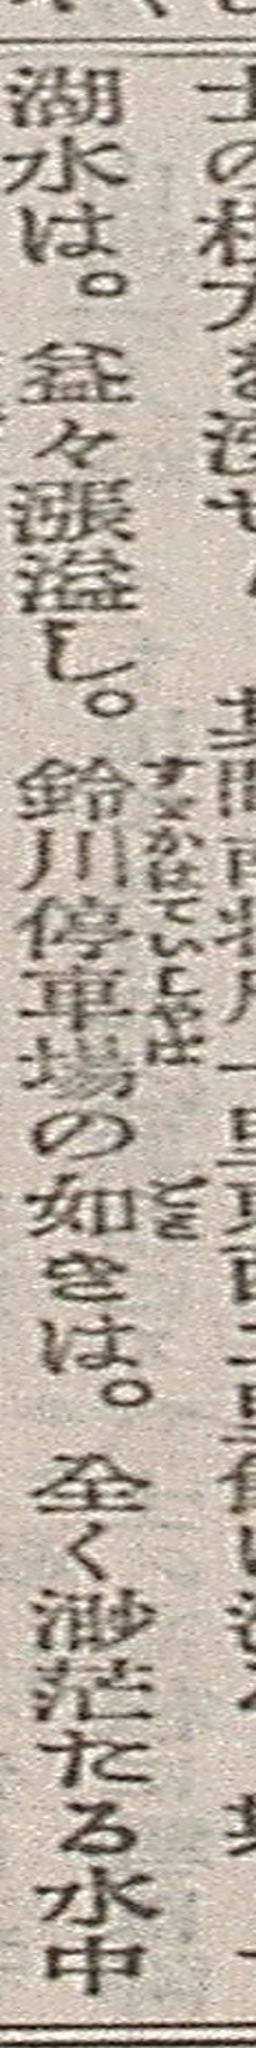湖水は。益々瀦溜し。鈴川停車場の如きは。全く渺茫たる水中
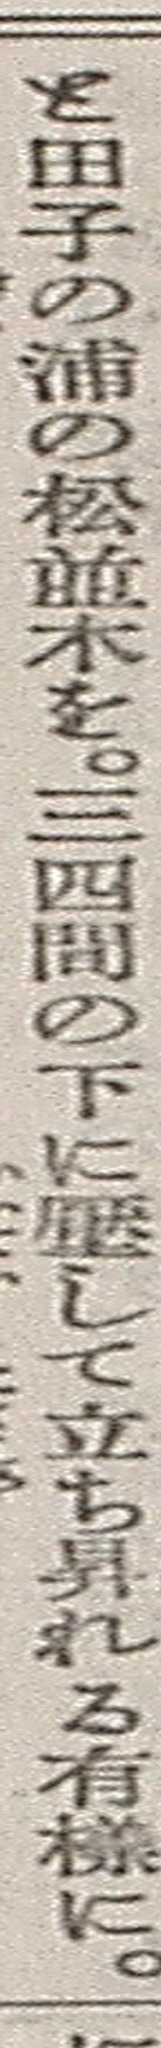と田子の浦の松並木を。三四間の下に圧して立ち昇れる有様に。
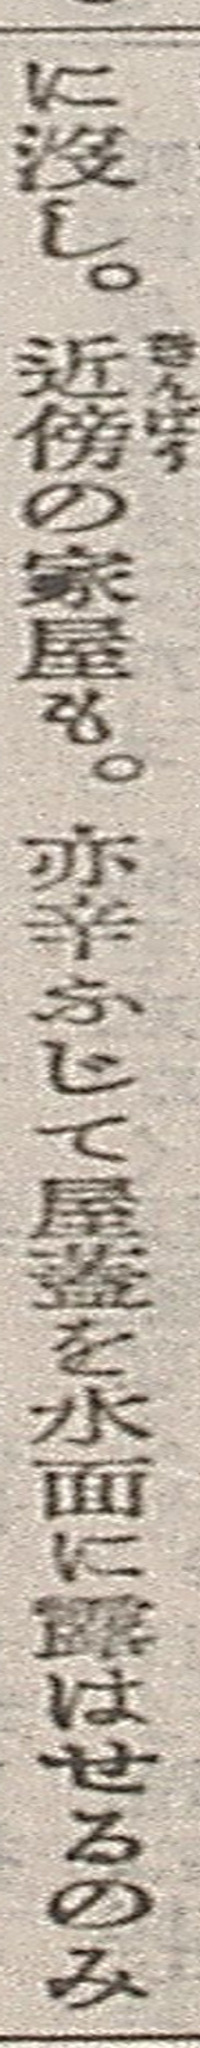に没し。近傍の家屋も。亦辛ふじて屋蓋を水面に露はせるのみ
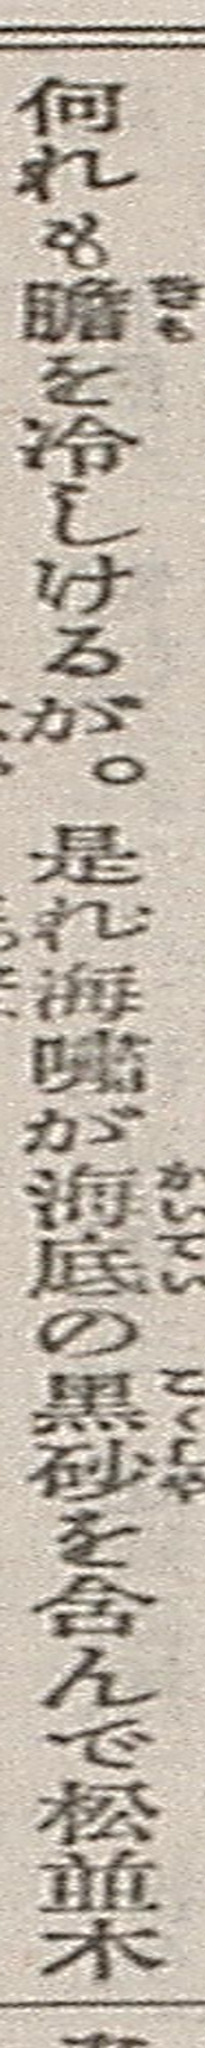何れも胆を冷しけるが。是れ海嘯が海底の黒砂を含んで松並木
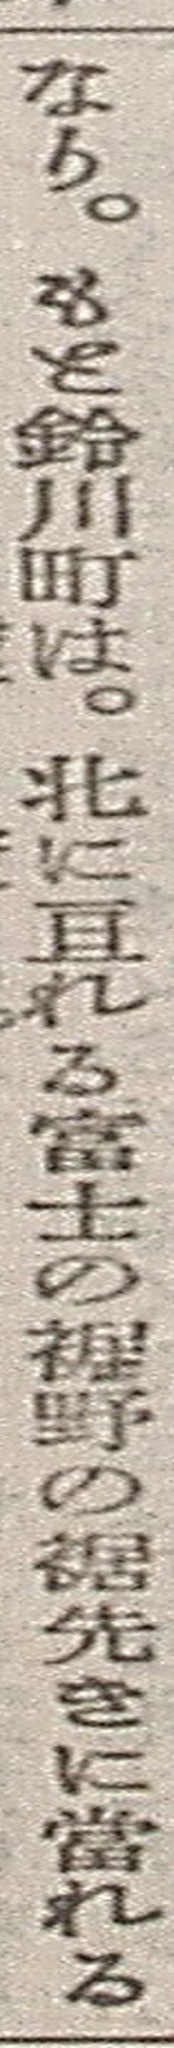なり。もと鈴川町は。北に亘れる富士の裾野の裾先きに当れる
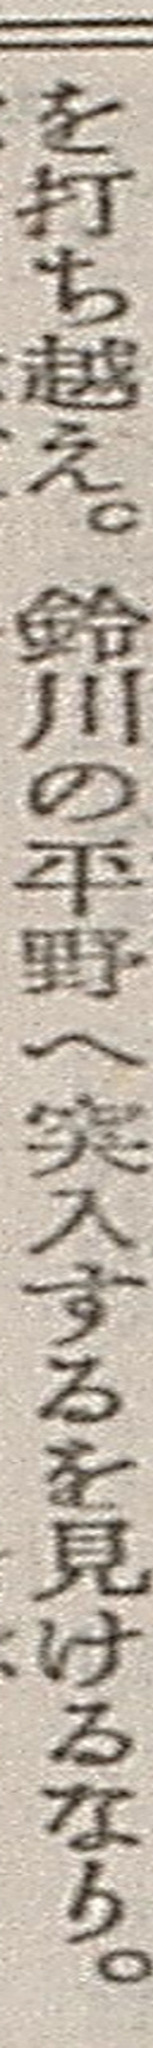を打ち越え。鈴川の平野へ突入するを見けるなり。
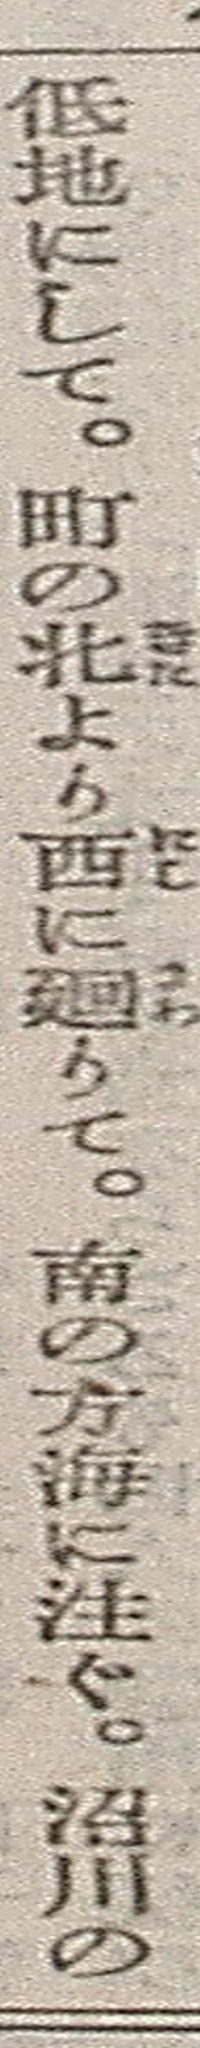低地にして。町の北より西に廻りて。南の方海に注ぐ。沼川の
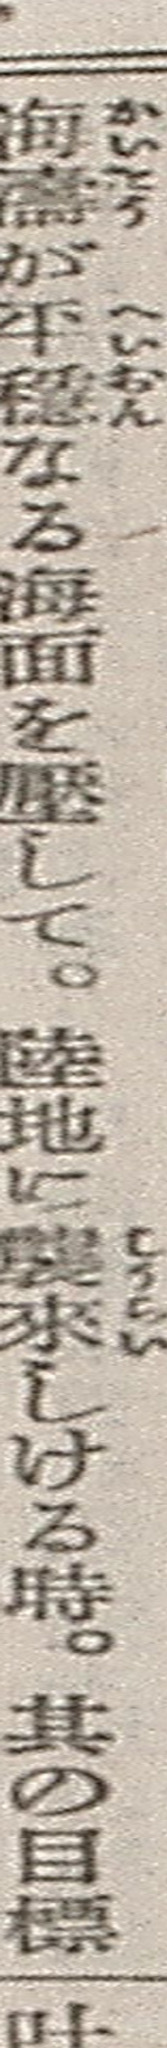海嘯が平穏なる海面を圧して。陸地に襲来しける時。其の目標
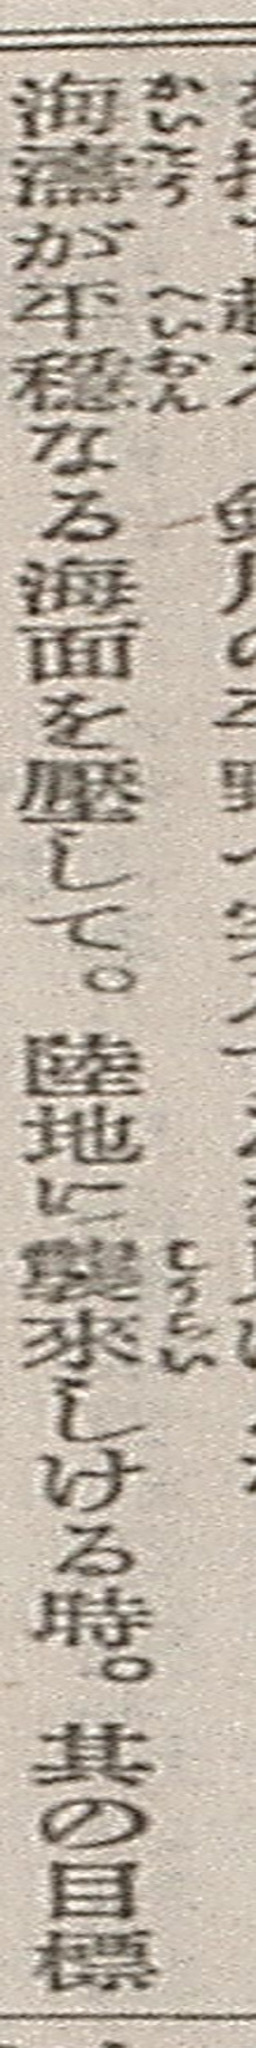海嘯が平穏なる海面を圧して。陸地に襲来しける時。其の目標
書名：風俗畫報臨時増刊第百九十九號　明治三十二年十月各地災害圖會（前編之續）
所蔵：東京大学地震研究所図書室 Earthquake Research Institute Library, The University of Tokyo, JAPAN
